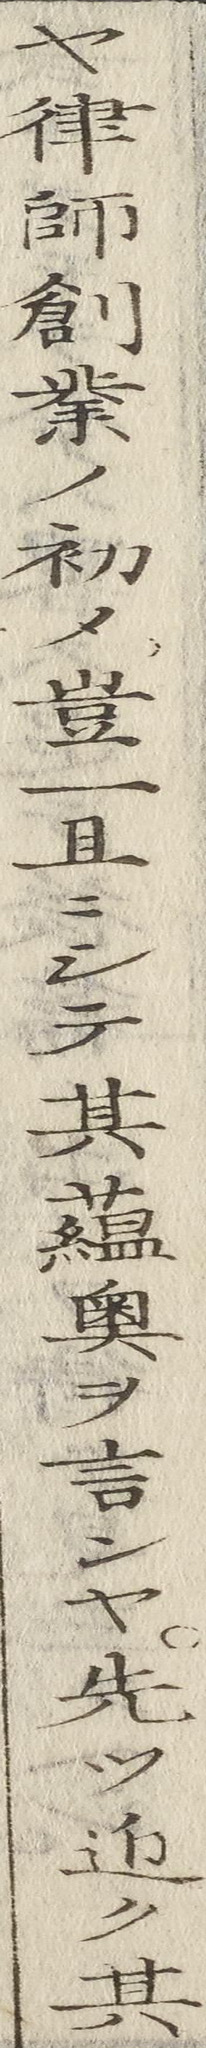ヤ律師創業ノ初メ豈一且ニシテ其蘊奥ヲ言ンヤ。先ツ近ク其
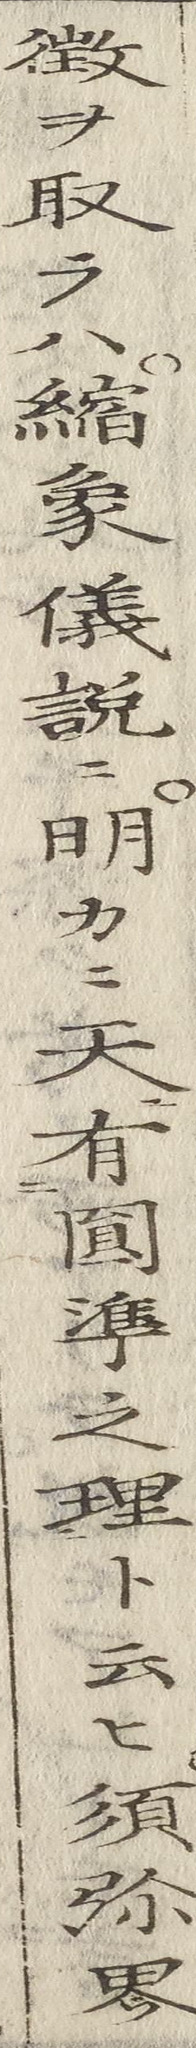徴ヲ取ラハ。縮象儀説ニ。明カニ天有円準之理ト云ヒ。須弥界
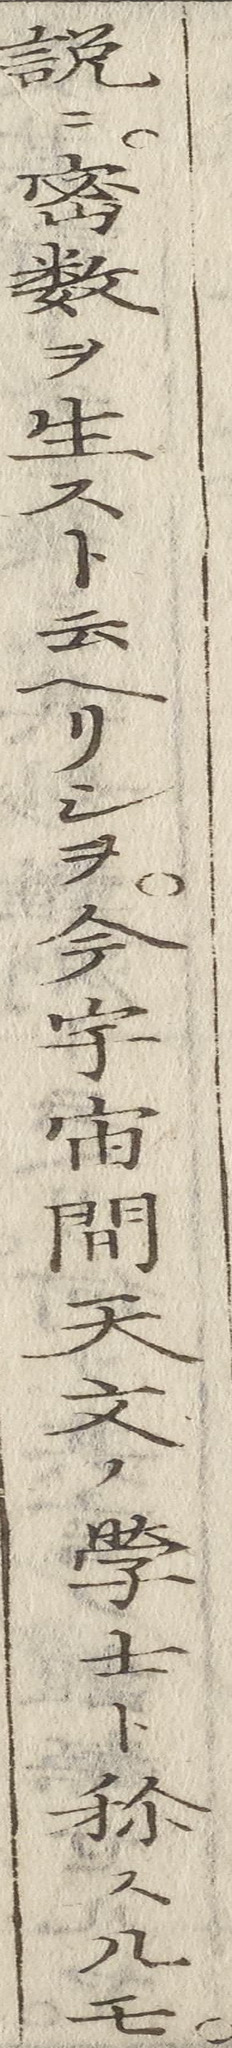説ニ。密教ヲ生スト云ヘリシヲ。今宇宙間天文ノ学士ト称スルモ。
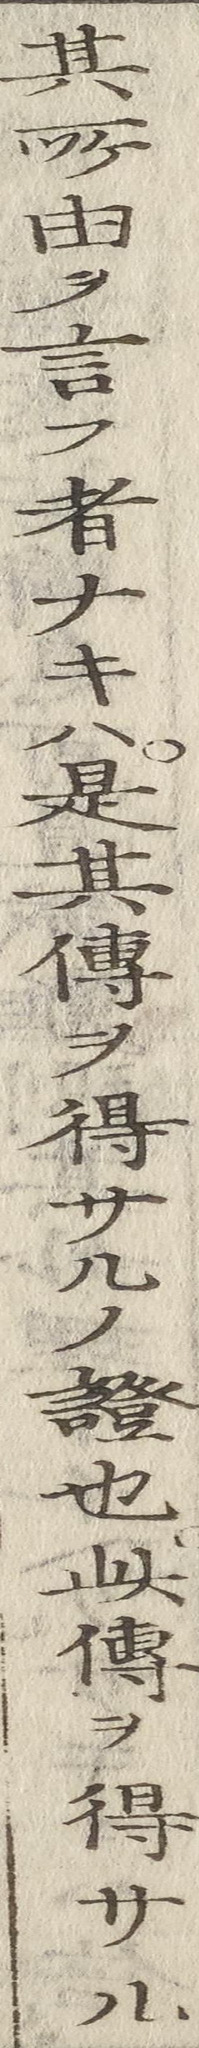其所由ヲ言フ者ナキハ。是其伝ヲ得サルノ証也。此伝ヲ得サル
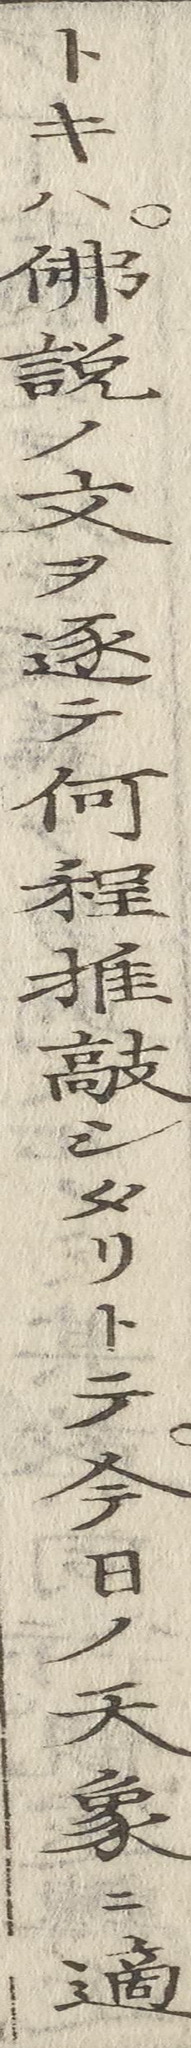トキハ。仏説ノ文ヲ逐テ何程推敲シタリトテ。今日ノ天象ニ。適
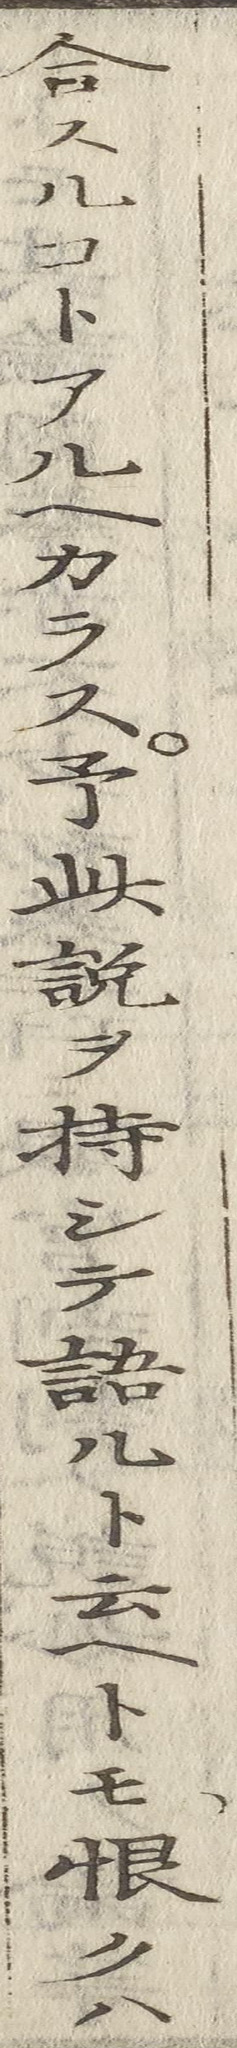合スルコトアルヘカラス。予此説ヲ持シテ語ルト云ヘトモ恨クハ
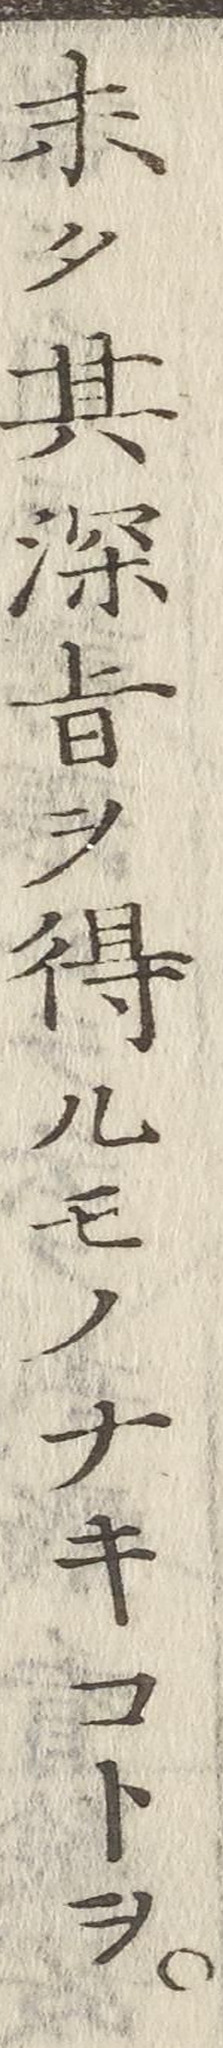未タ其深旨ヲ得ルモノナキコトヲ。
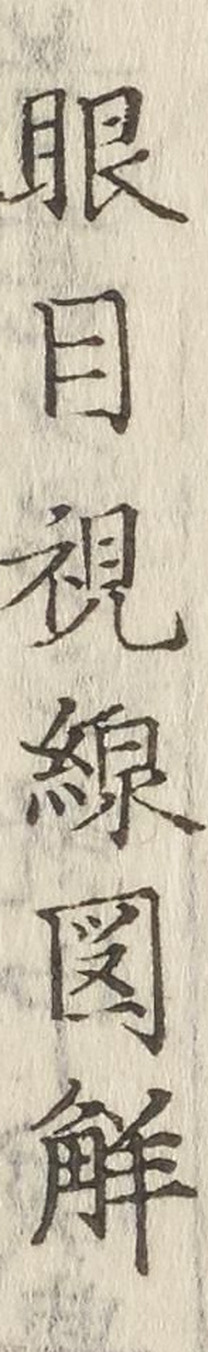眼目視線図解
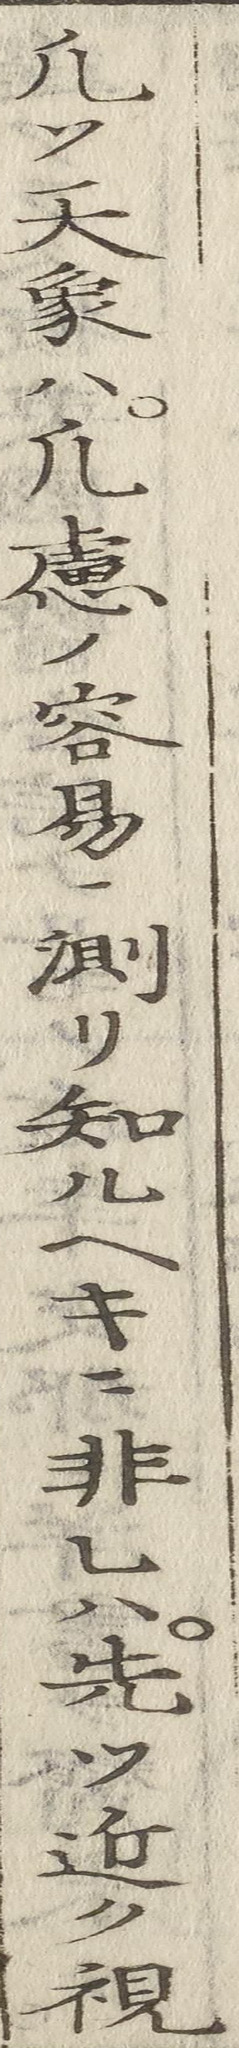凡ソ天象ハ。凡慮ノ容易ニ測リ知ルヘキニ非レハ。先ツ近ク視
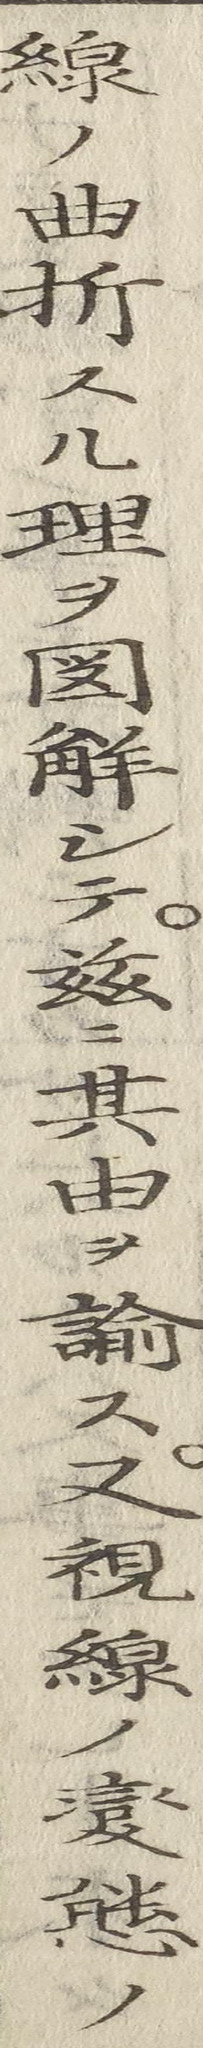線ノ曲折スル理ヲ図解シテ。茲ニ其由ヲ論ス。又視線ノ変態ノ

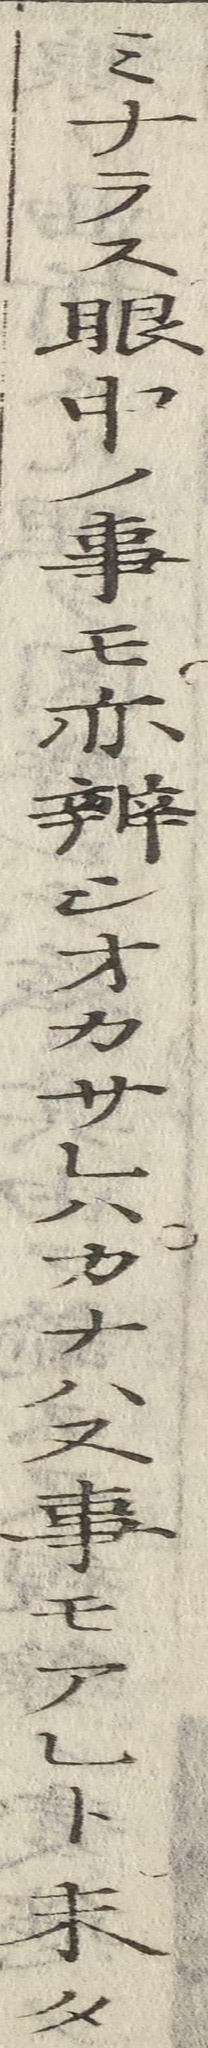ミナラス眼中ノ事モ亦弁シオカサレハカナハス事モアレト未タ
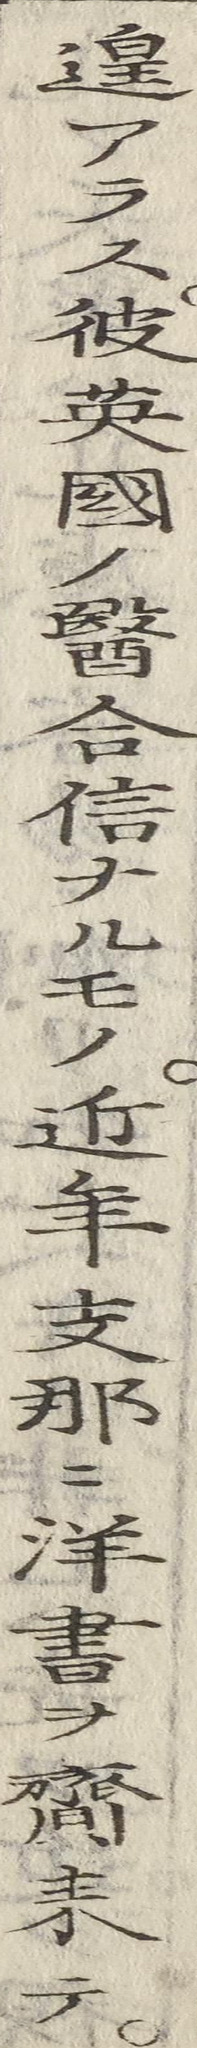遑アラス。彼英国ノ医合信ナルモノ。近年支那ニ洋書ヲ齎来テ。
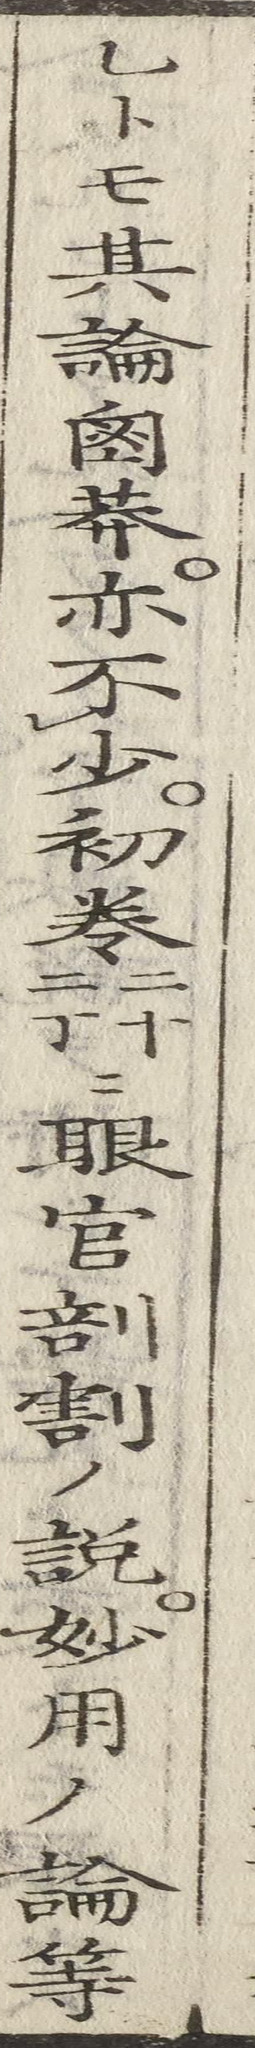レトモ其論鹵莽。亦不少。初巻二十二丁ニ眼官剖割ノ説。妙用ノ論等
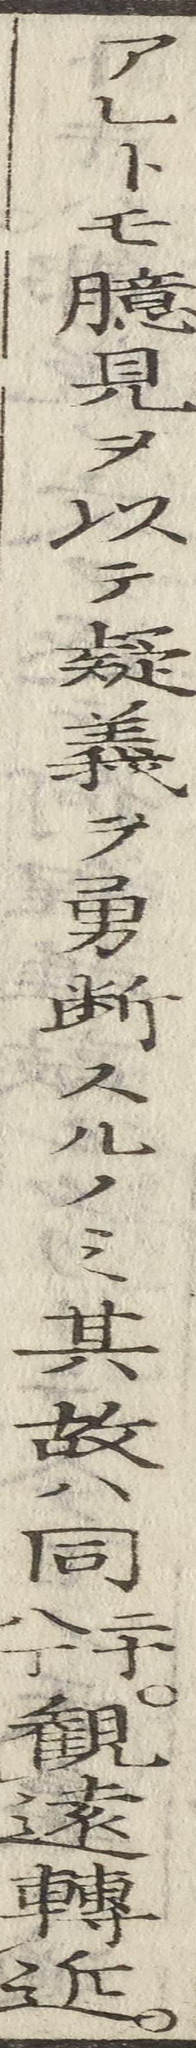アレトモ。臆見ヲ以テ疑義ヲ勇断スルノミ其故ハ同二十八丁観遠転近。
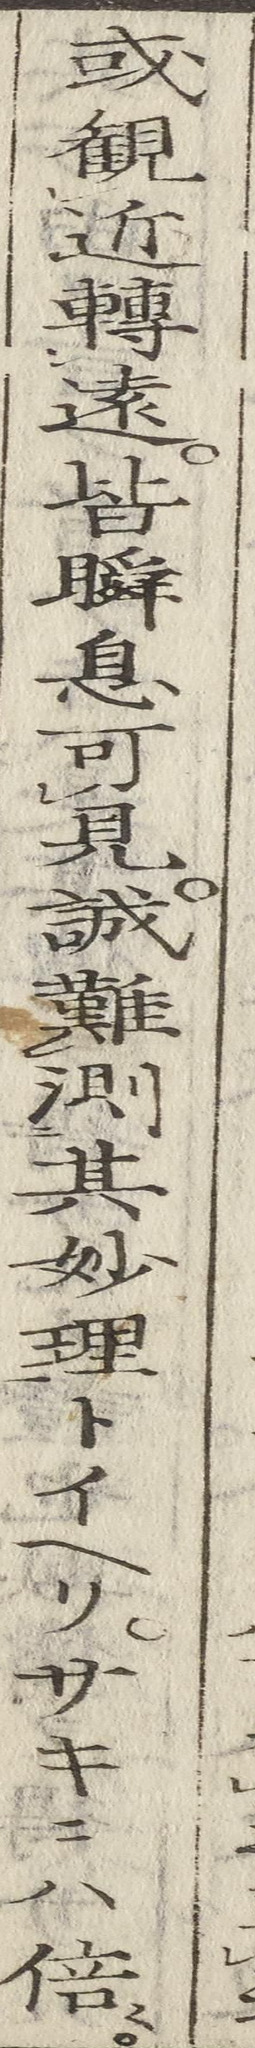或観近転遠。皆瞬息可見。誠難測其妙理トイヘリ。サキニハ倍〳〵。
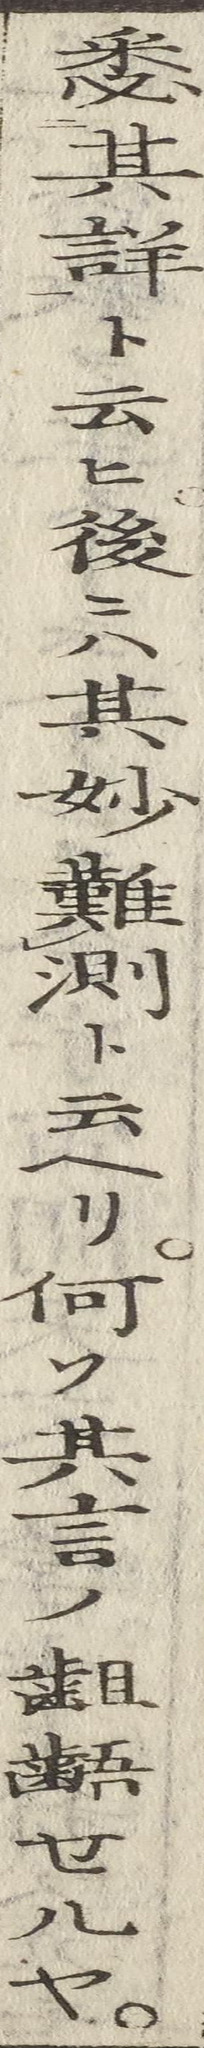悉其詳ト云ヒ。後ニハ其妙難測ト云ヘリ。何ソ其言ノ齟齬セルヤ。
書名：護法新論　上
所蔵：東京大学地震研究所図書室 Earthquake Research Institute Library, The University of Tokyo, JAPAN
